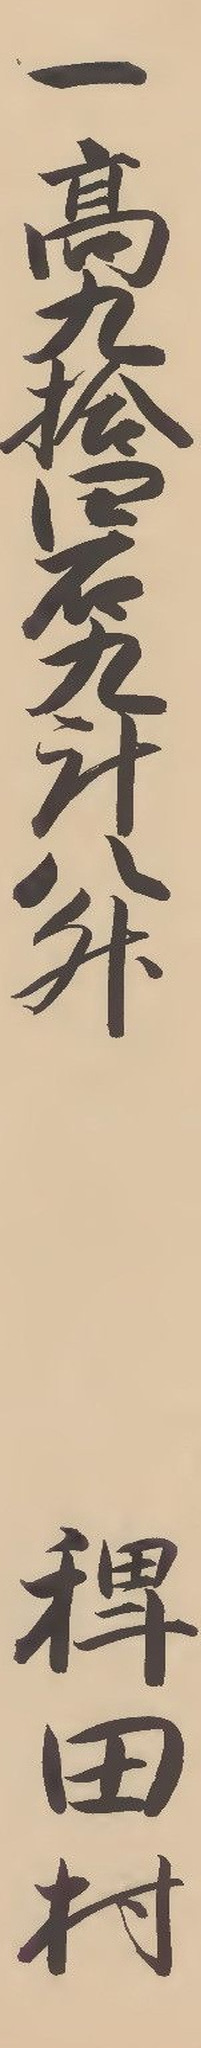一高九拾四石九斗八升稗田村
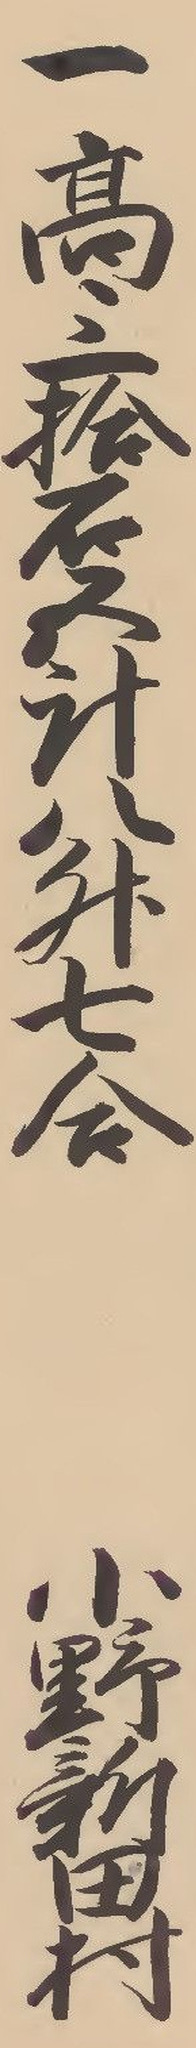一高三拾石五斗八升七合小野新田村

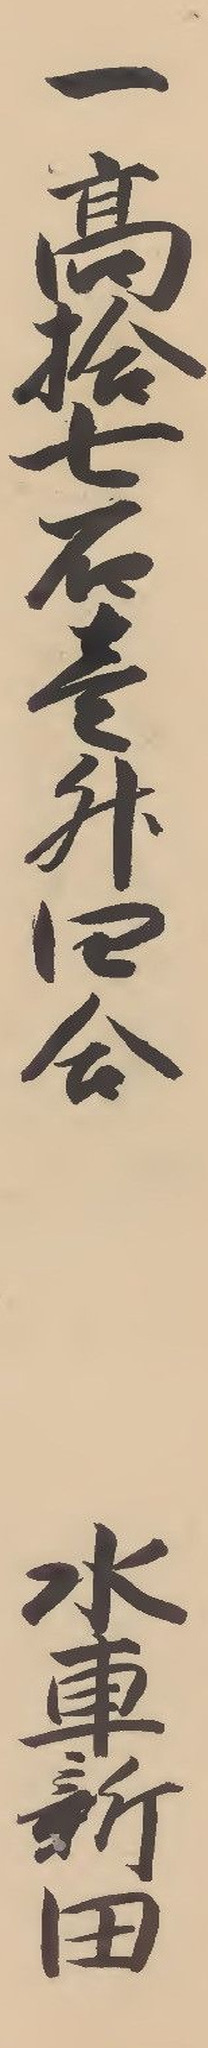一高拾七石壱升四合水車新田
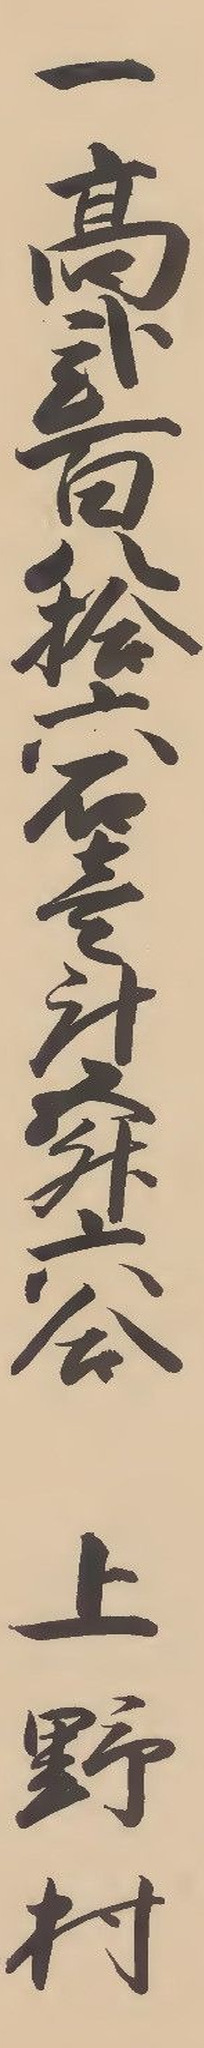一高弐百八拾六石壱斗五升六合上野村
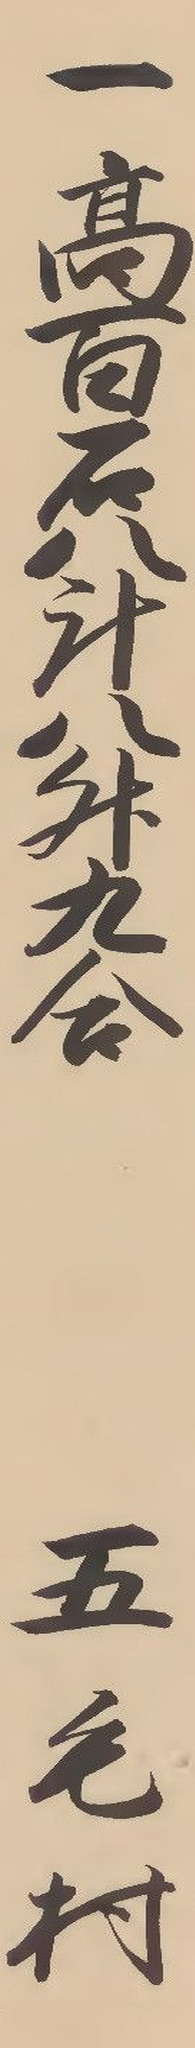一高百石八斗八升九合五毛村
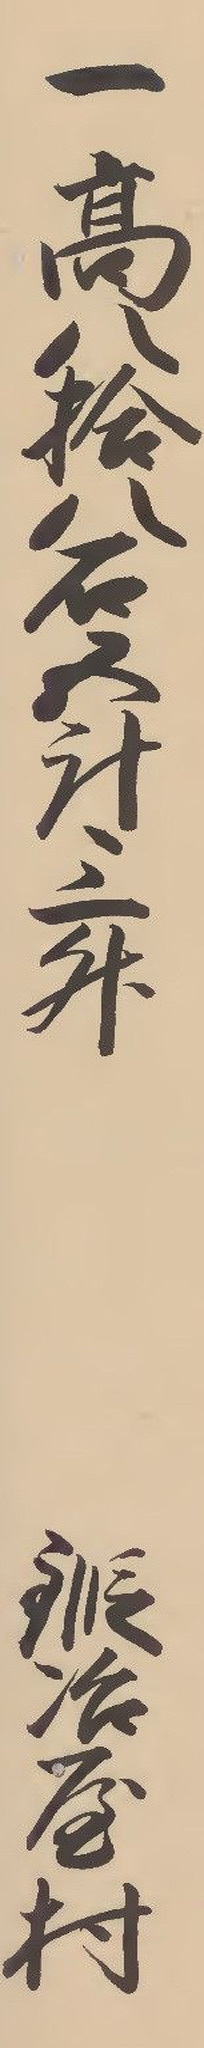一高八拾八石五斗三升鍛冶屋村
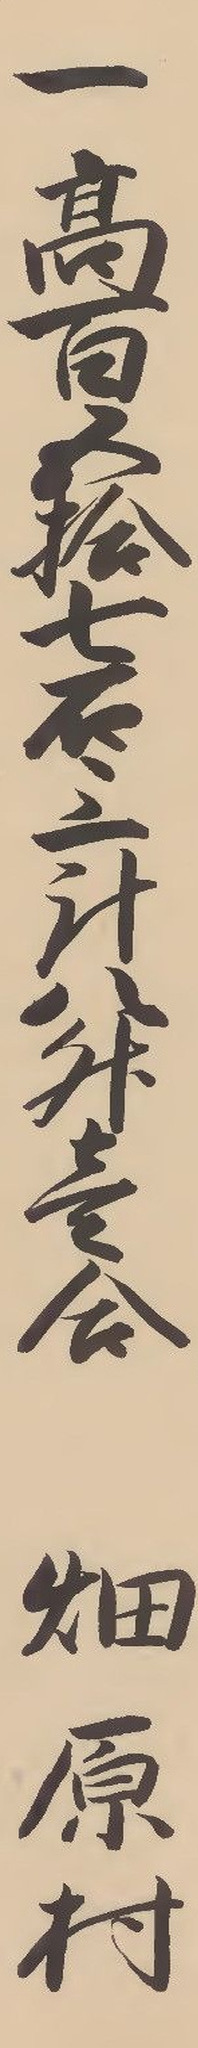一高五拾七石三斗八升壱合畑原村
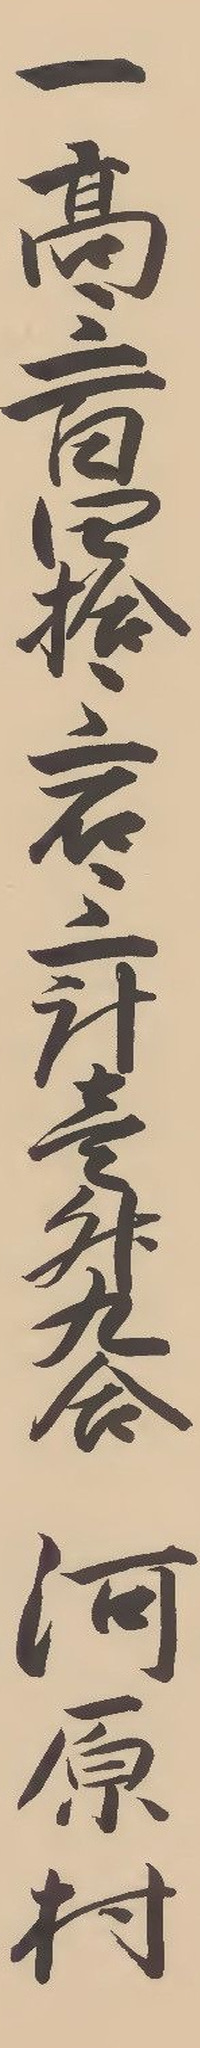一高三百四拾三石三斗壱升九合河原村
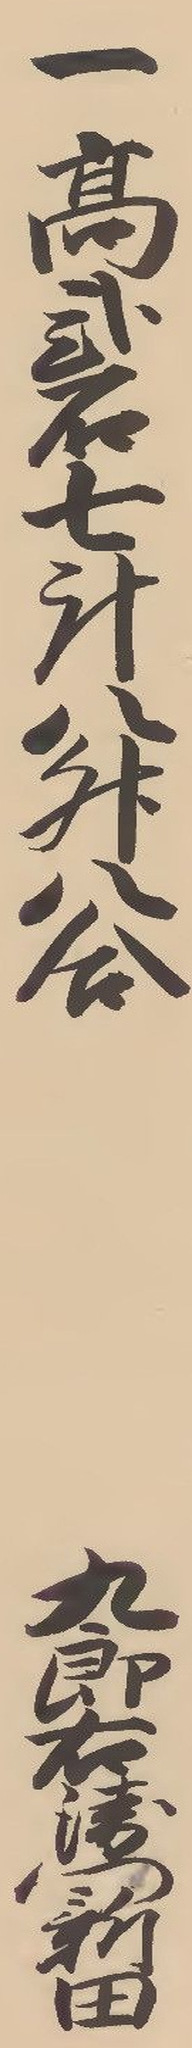一高弍石七斗八升八合九郎右衛門新田

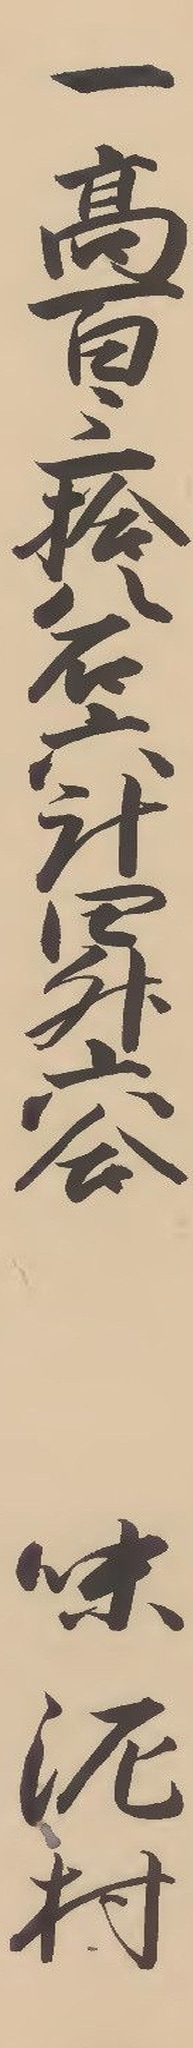一高百三拾八石六斗四升六合味泥村
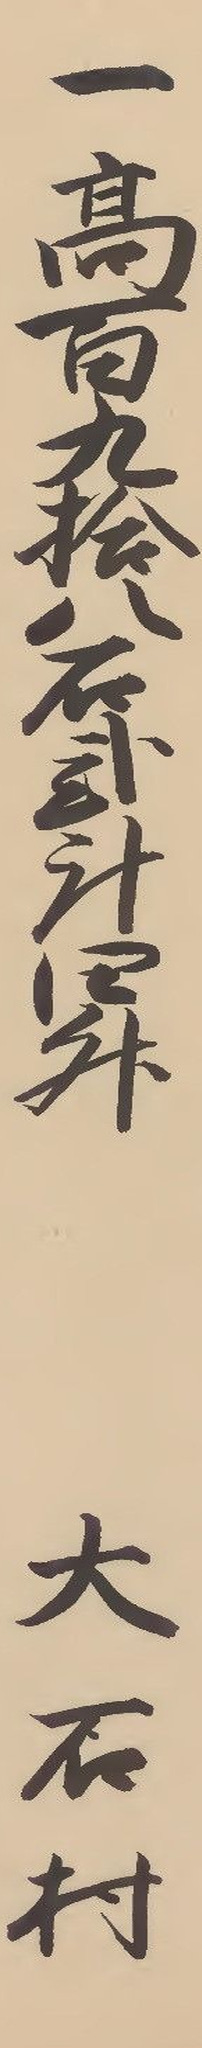一高百九拾八石弐斗四升大石村
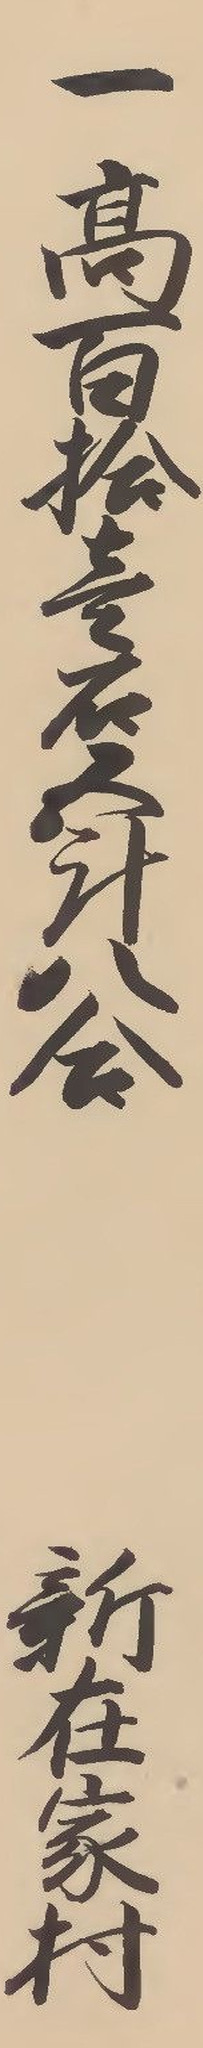一高百拾壱石五斗八合新在家村
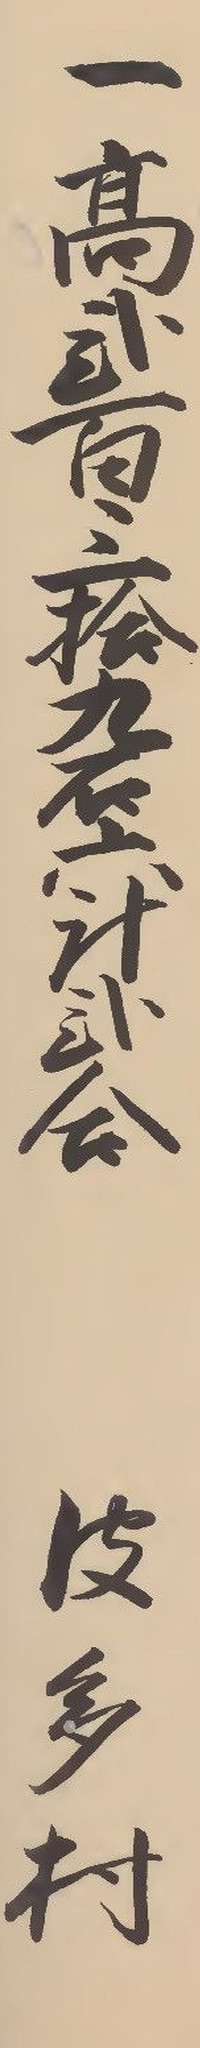一高二百三拾九石六斗弐合皮多村
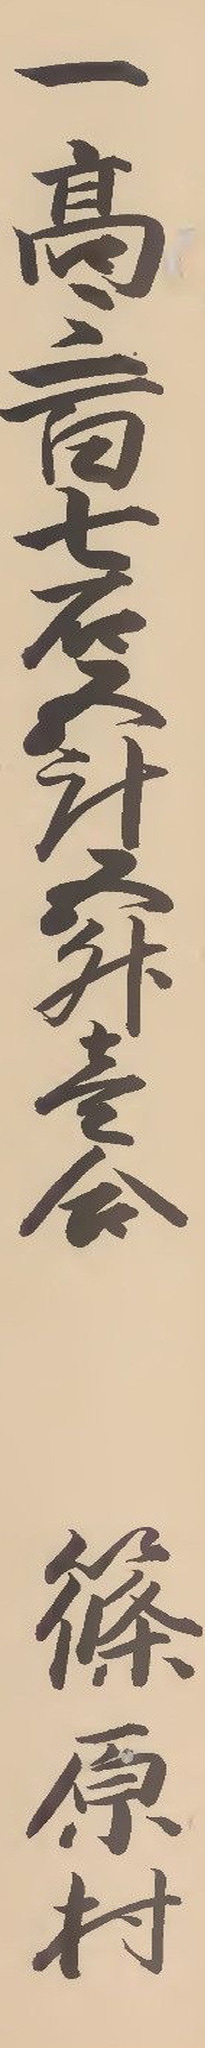一高三百七石五斗五升壱合篠原村
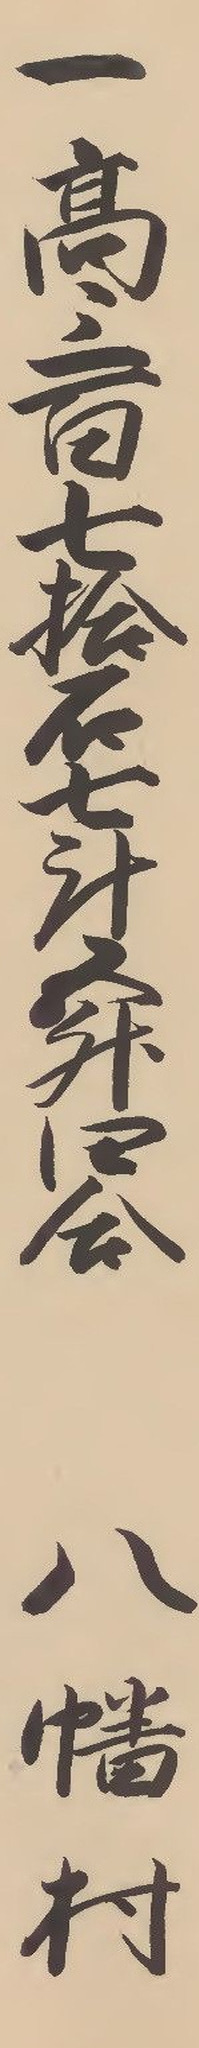一高三百七拾石七斗五升四合八幡村
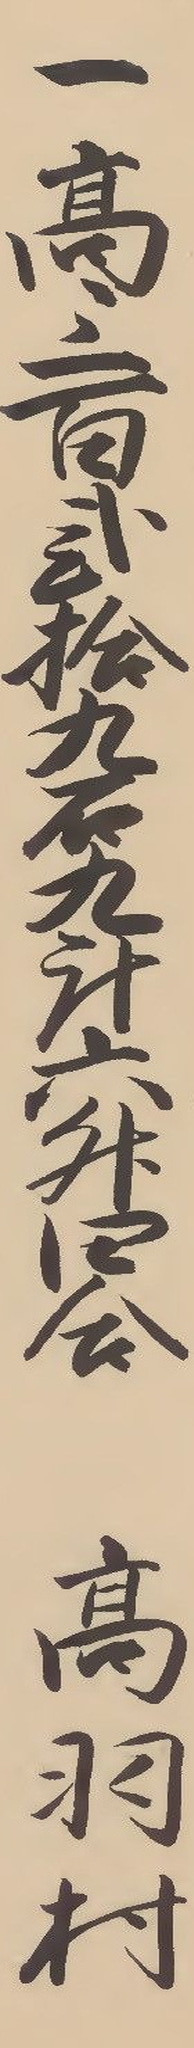一高三百弐拾九石九斗六升四合高羽村
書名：摂津国郷帳
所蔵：国立公文書館 National Archives of Japan
